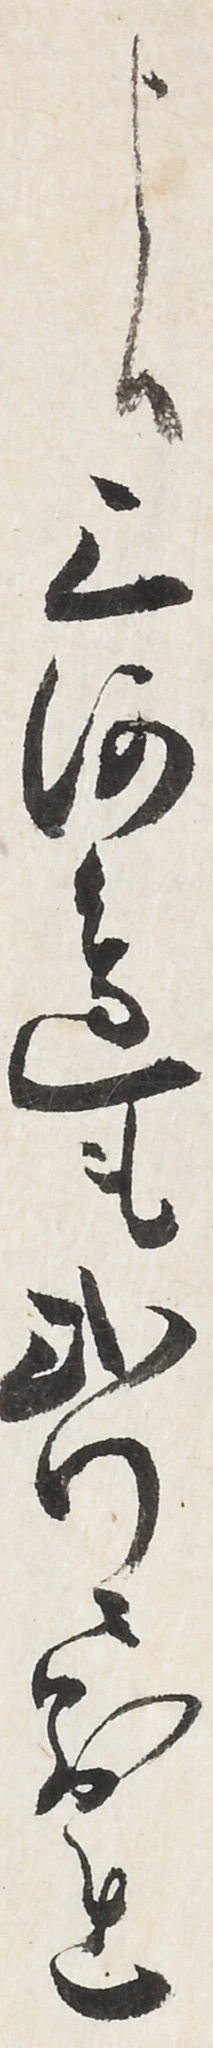申候三河辺も弐つに別れ
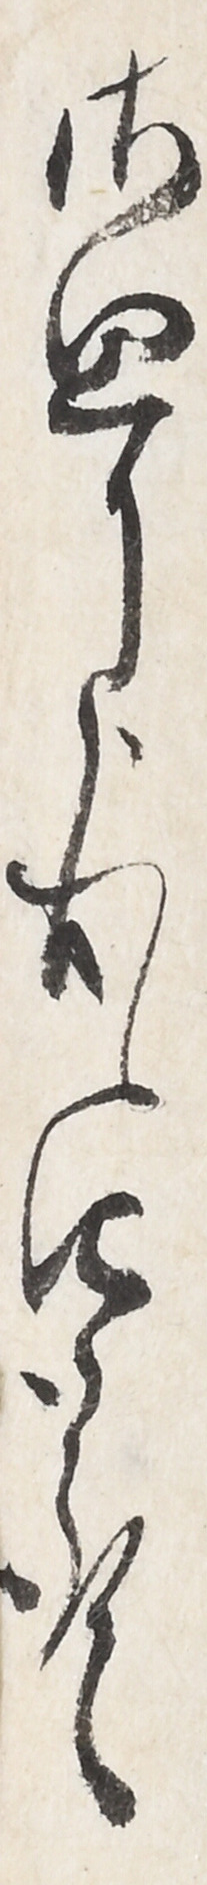御廻り被成候由御座候
